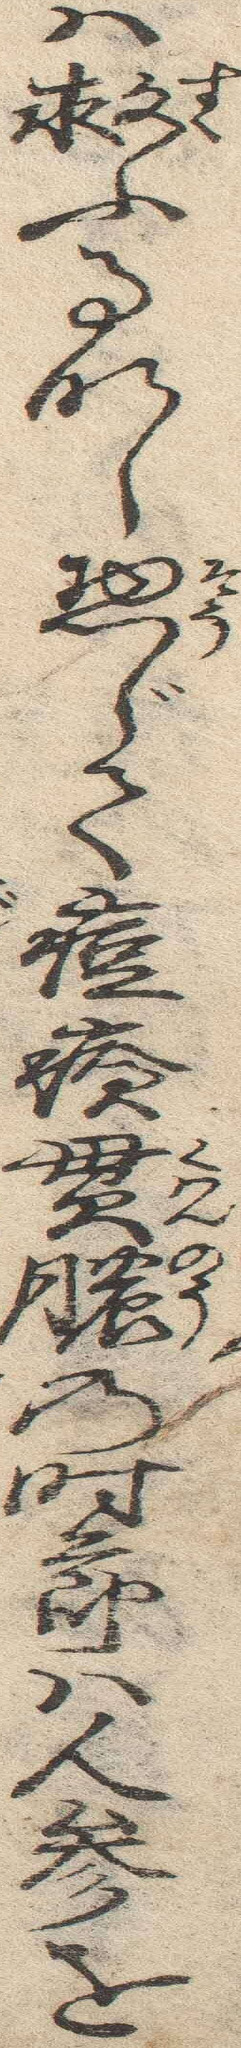は救ふ事なし総じて痘瘡貫膿の時節は人参を
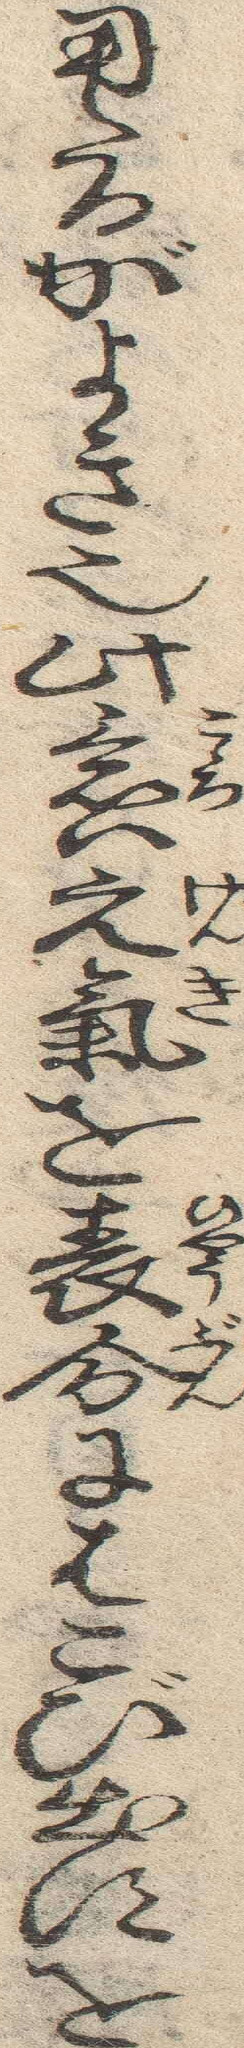用たるがよき也此意は元気を表分にはこび出すを
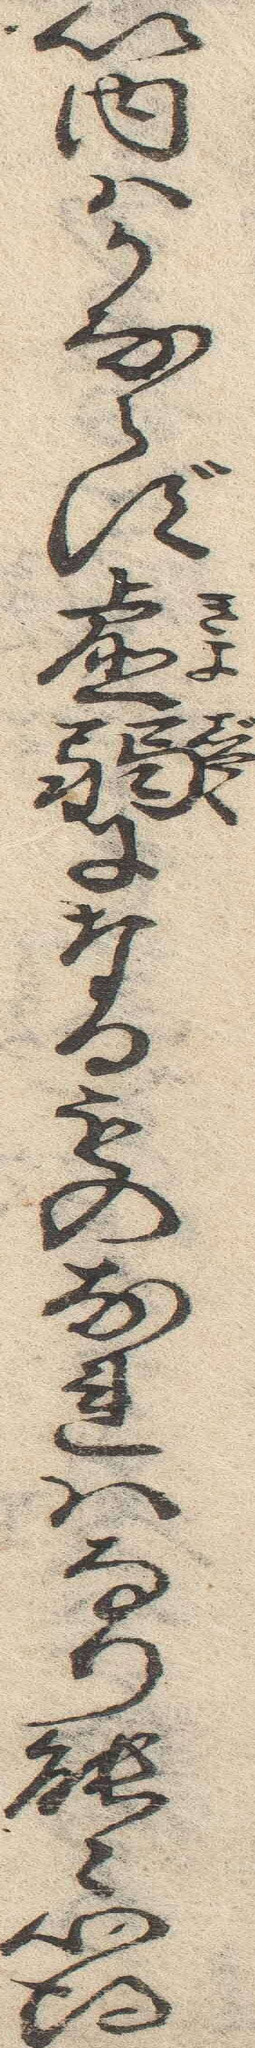以内はかならず虚弱になるものなれはなり能々心得
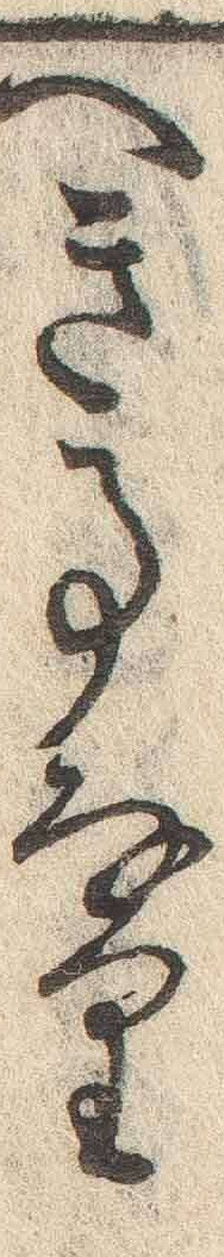へき事なり
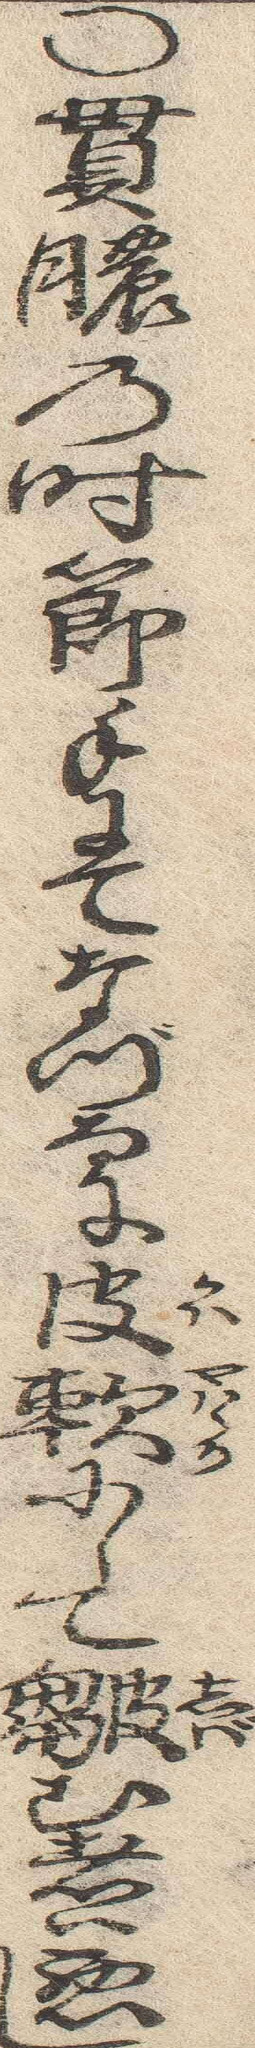○貫膿の時節手にてなづるに皮軟にして皺む者は悪し
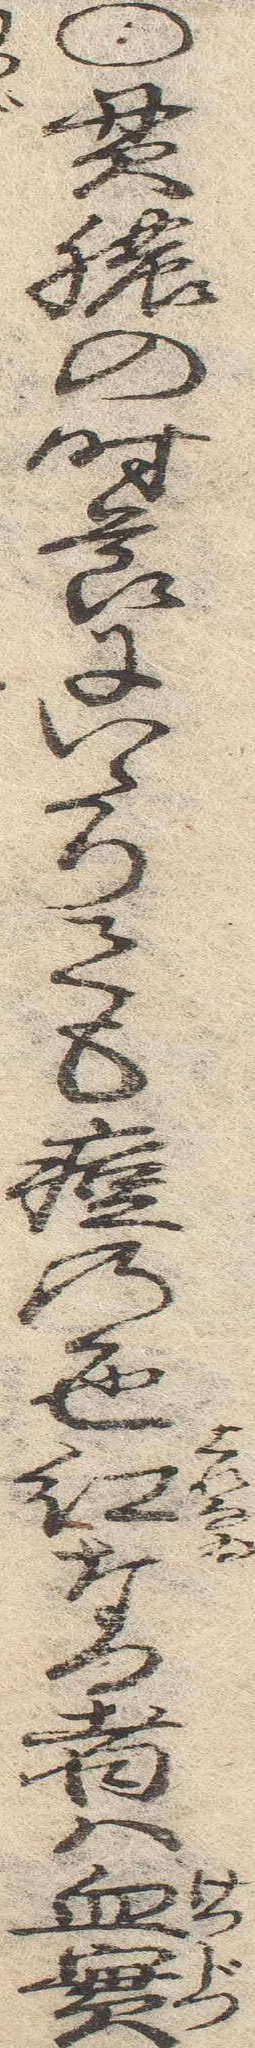○貫膿の時節にいたりても痘の色紅なる者は血実
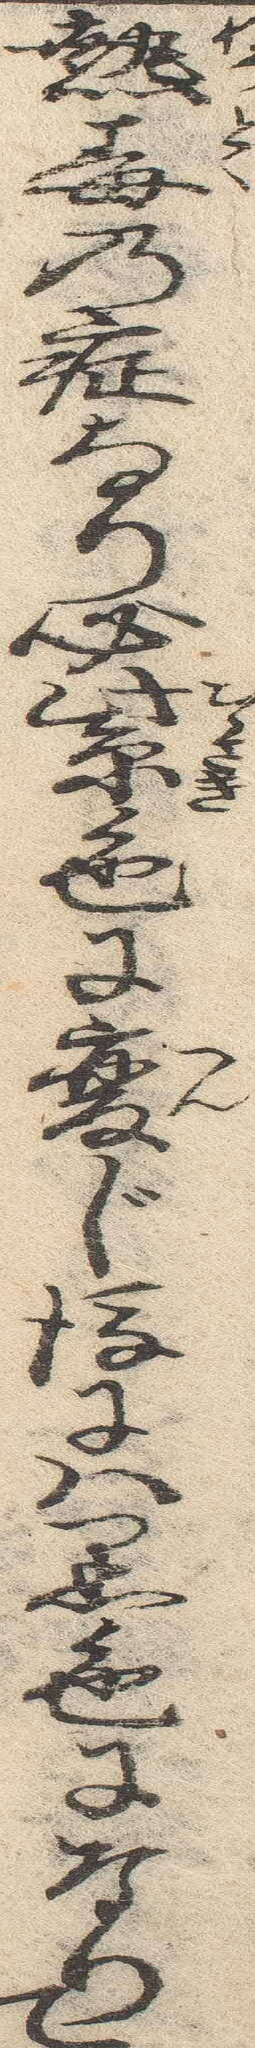熱毒の症なり必紫色に変じ後には黒色になりて
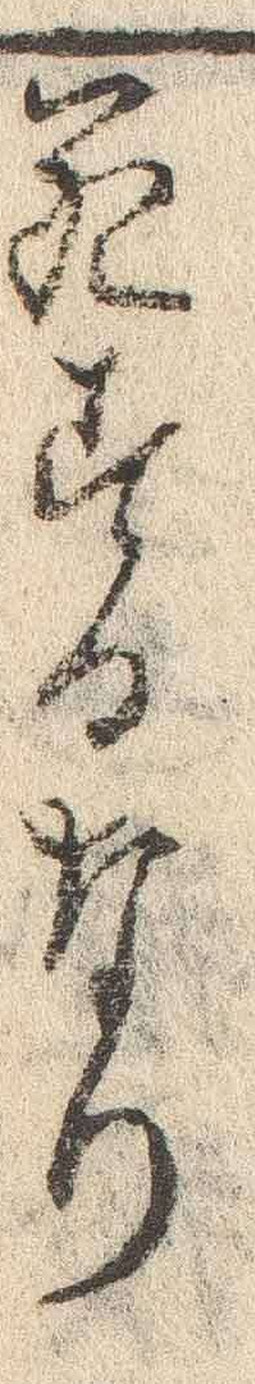死するなり
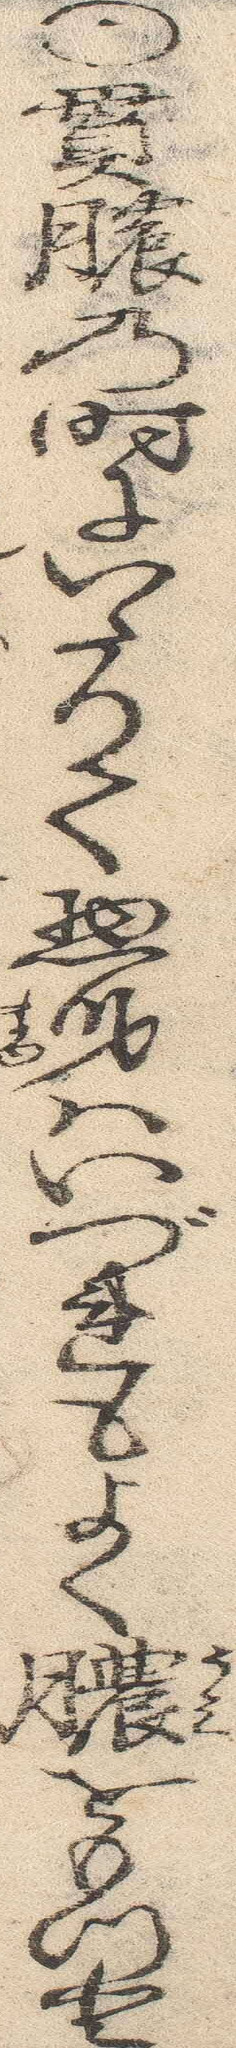○貫膿の時にいたりて総身はいづれもよく膿をもつと
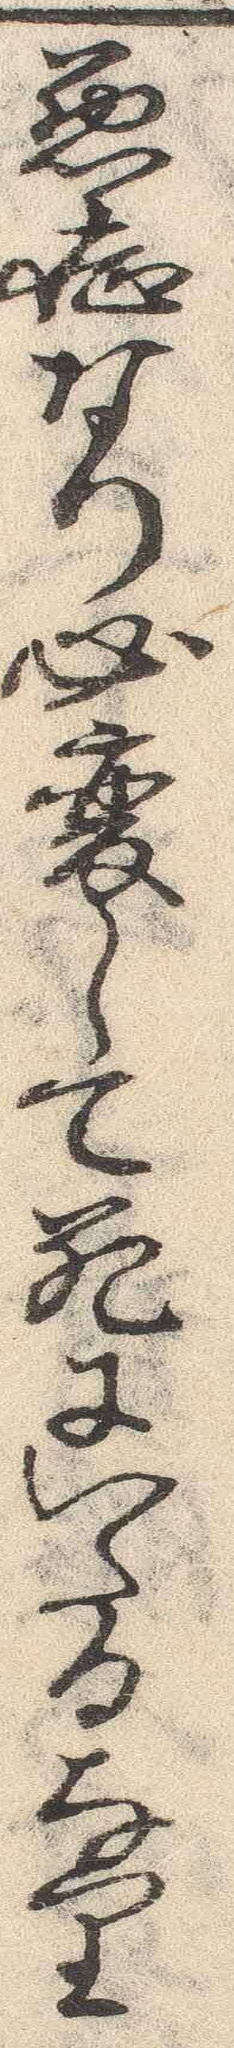悪症なり必変して死にいたるなり
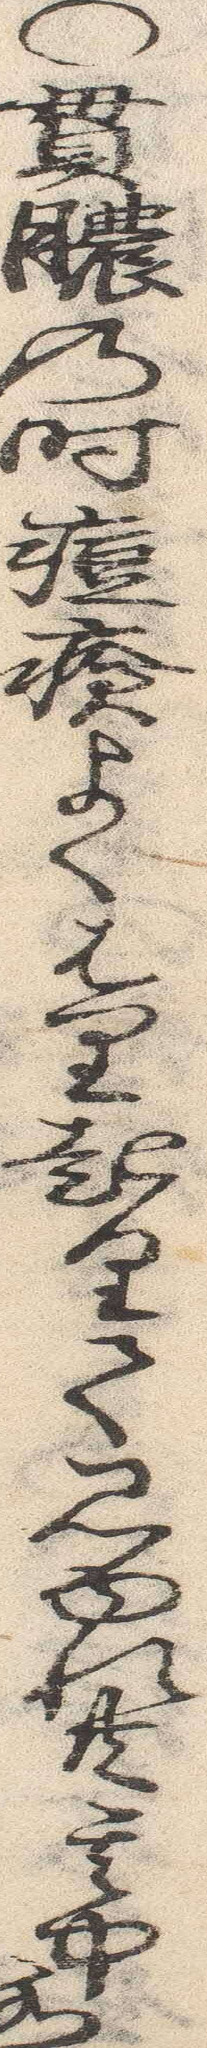○貫膿の時痘瘡よくはり起りて見ゆれ共其中水
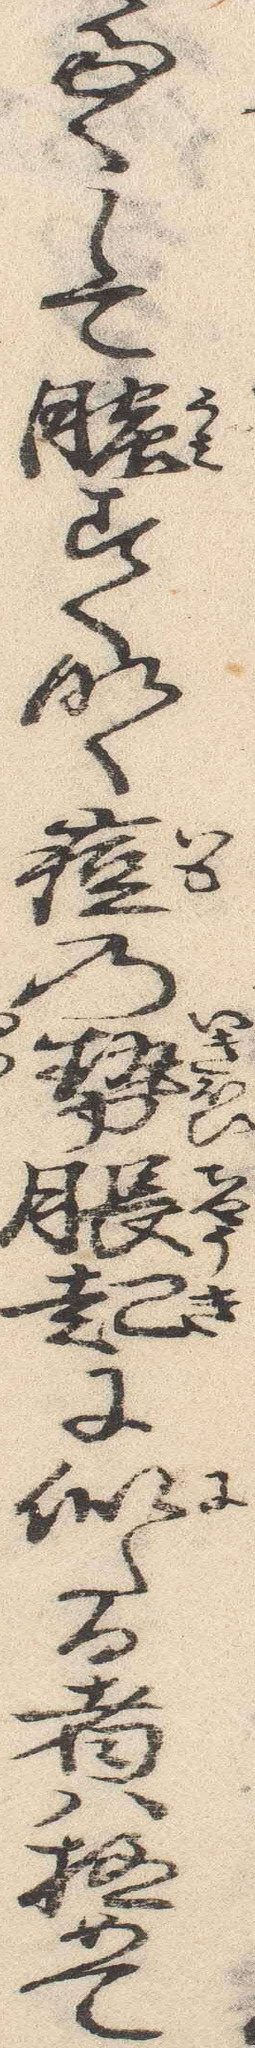多くして膿すくなく痘の勢脹起に似たる者は極めて
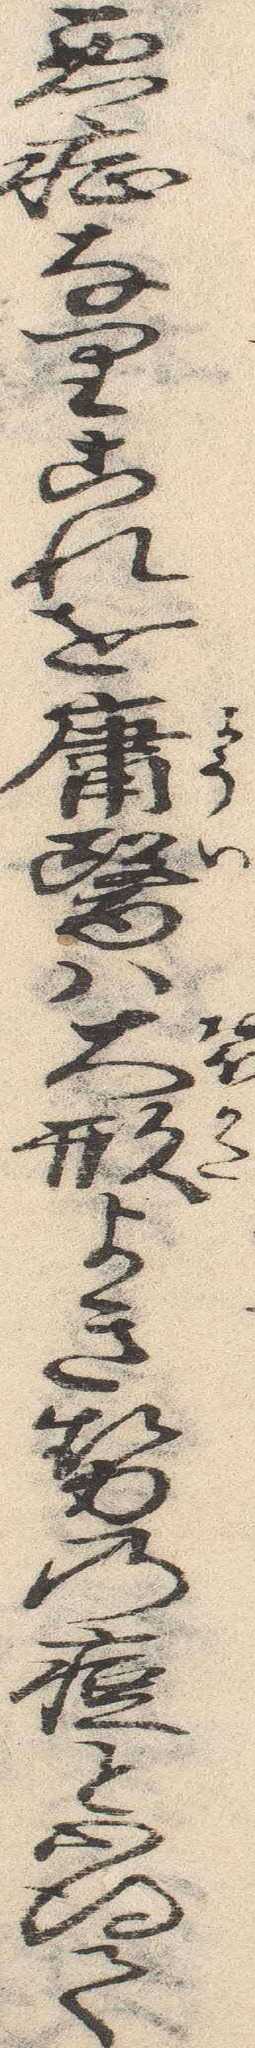悪症なりこれを庸医は大形よき勢の痘と心得て
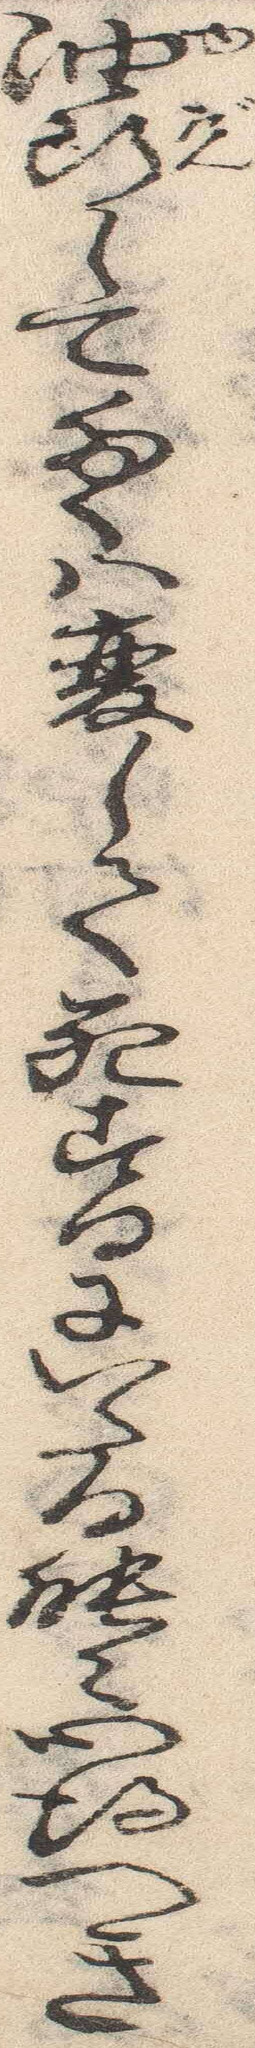油断して多くは変して死するにいたる能々心得へき
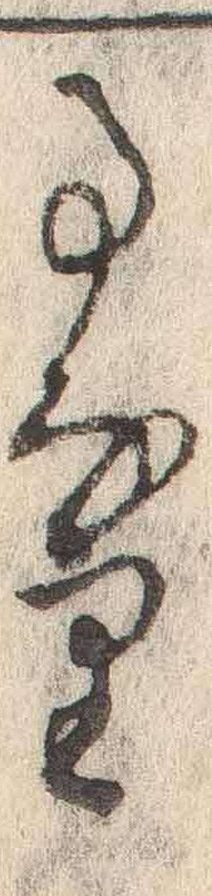事なり
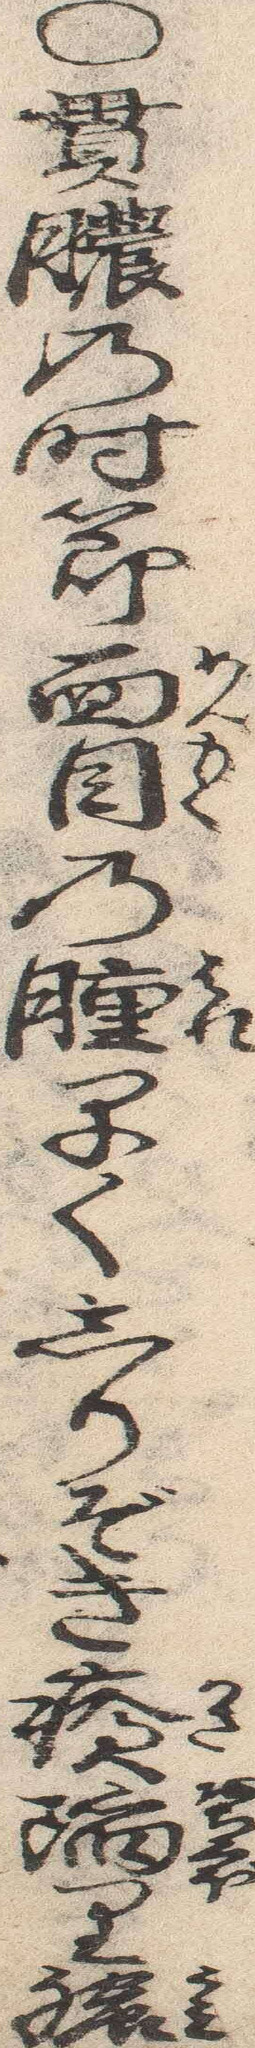○貫膿の時節面目の腫早くしりぞき瘡陥り膿
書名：小児必用養育草
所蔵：東京学芸大学附属図書館 国文学研究資料館
